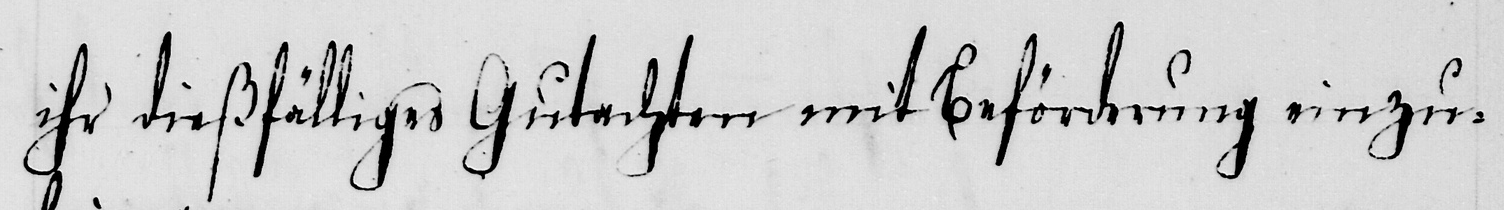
ihr dießfälliges Gutachten mit Beförderung einzu¬
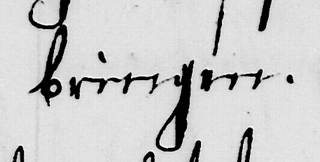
bringen.
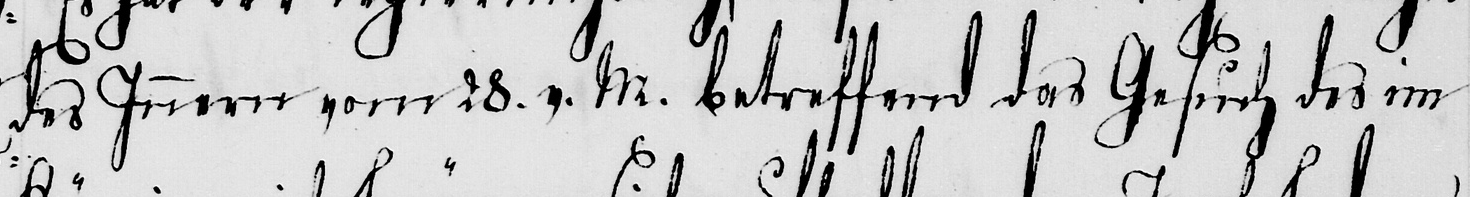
des Innern vom 28. v. M. betreffend das Gesuch des im
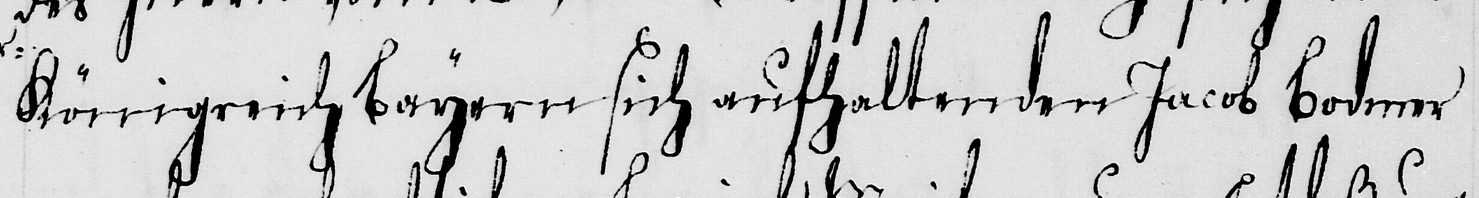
Königreich Bayern sich aufhaltenden Jacob Bodmer
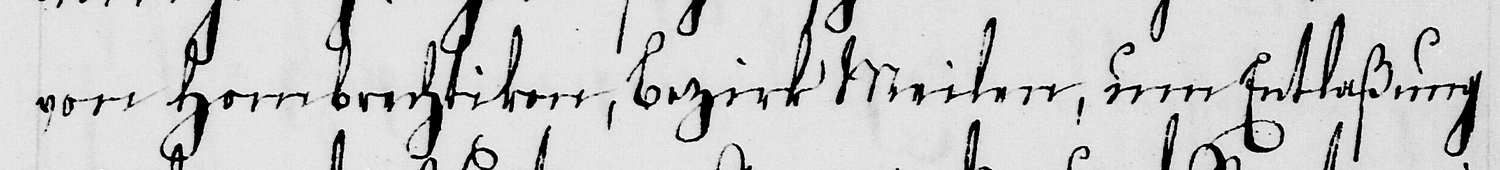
von Hombrechtikon, Bezirk Meilen, um Entlaßung
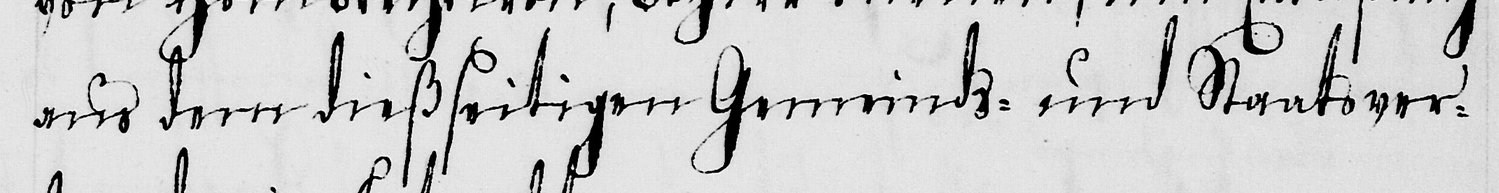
aus dem dießseitigen Gemeinds- und Staatsver¬
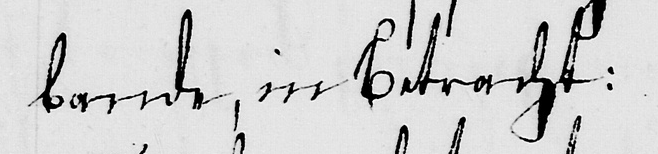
bande, in Betracht:
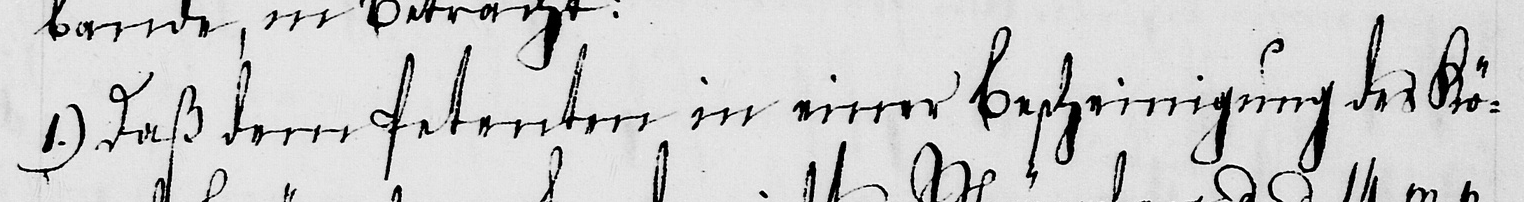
1.) Daß dem Petenten in einer Bescheinigung des Kö¬
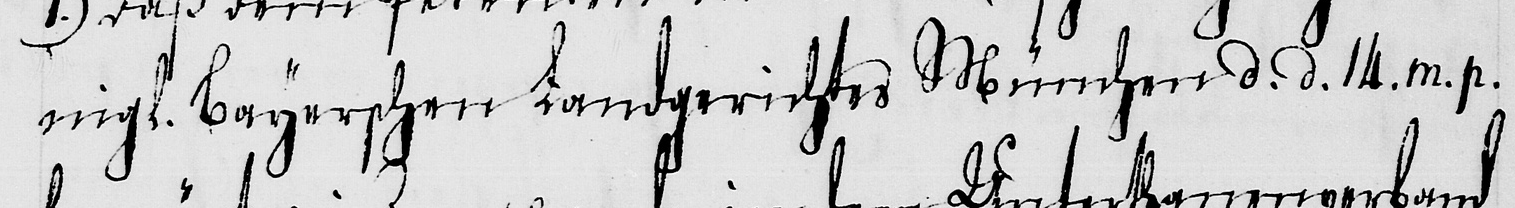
nigl. Bayerschen Landgerichtes München d. d. 14. m. p.
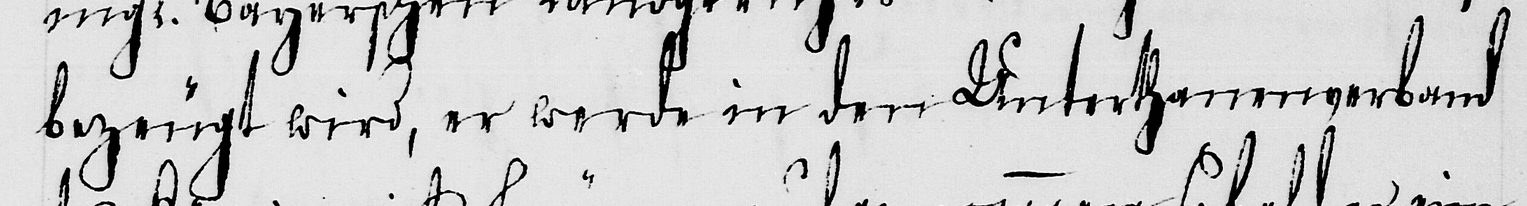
bezeugt wird, er werde in den Unterthanenverband
